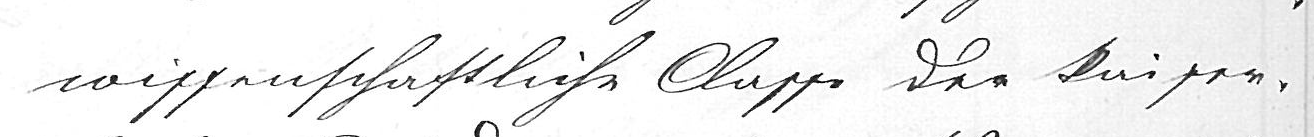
wissenschaftliche Classe der kaiser-
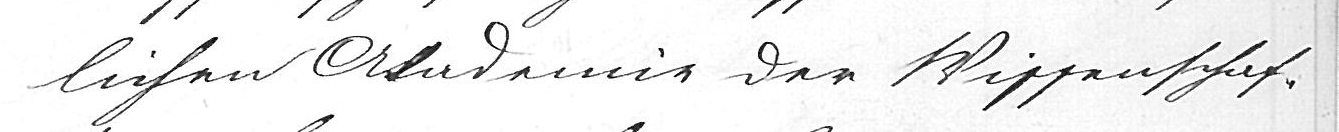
lichen Akademie der Wissenschaf-
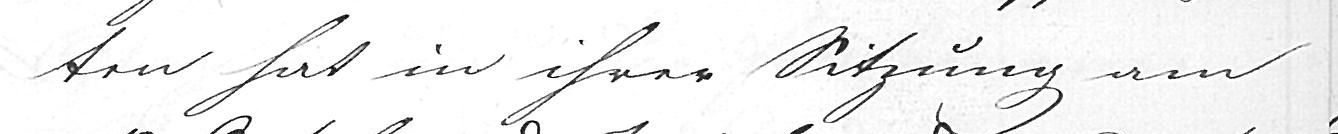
ten hat in ihrer Sitzung am
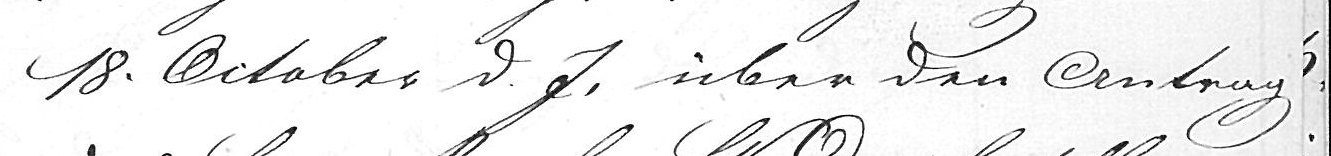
18. October d. J. über den Antrag
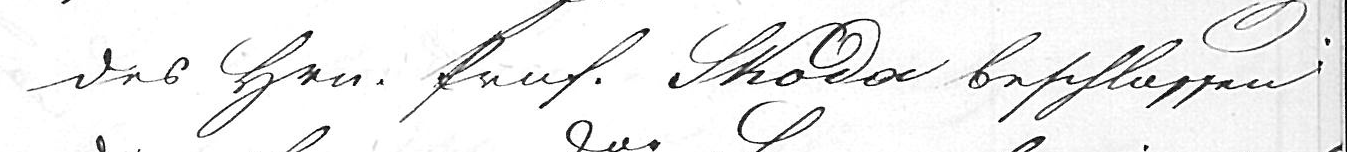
des Hrn. Prof. Skoda beschlossen
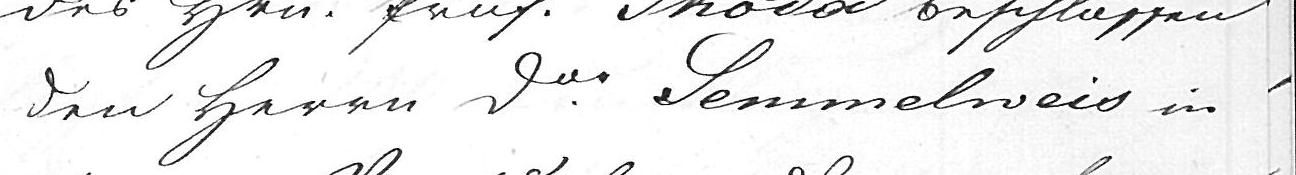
den Herrn Dor Semmelweis in
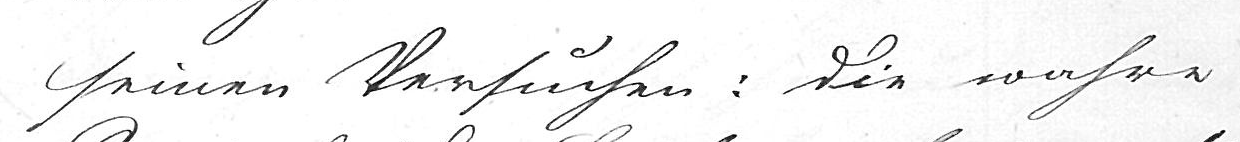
seinen Versuchen: die wahre
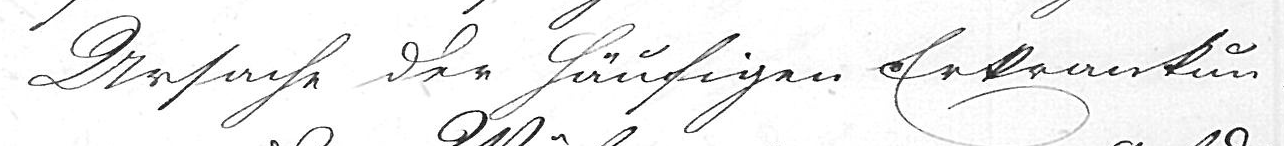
Ursache der häufigen Erkrankun-
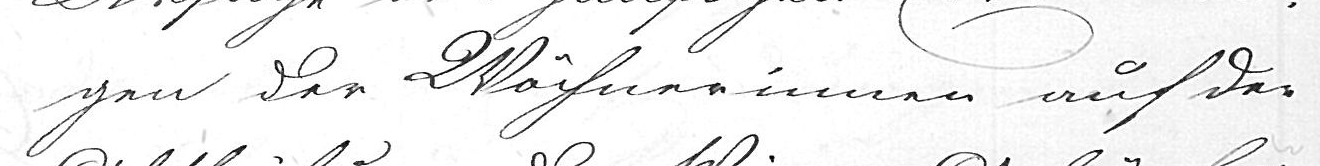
gen der Wöchnerinnen auf der
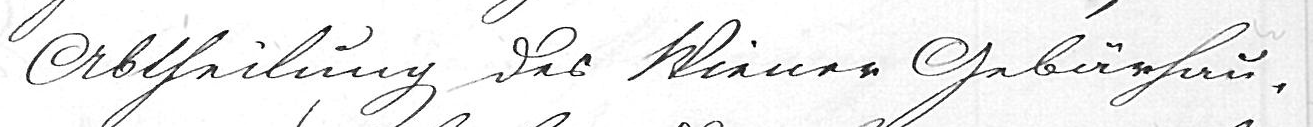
Abtheilung des Wiener Gebärhau-
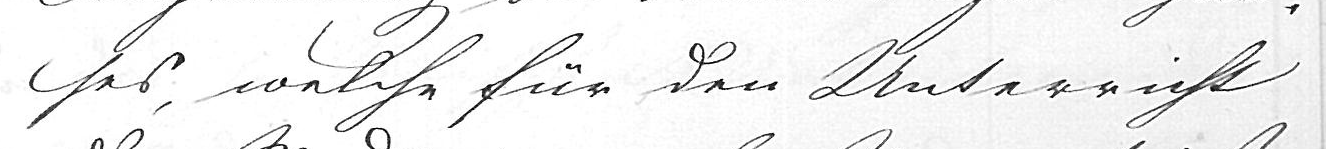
ses, welche für den Unterricht
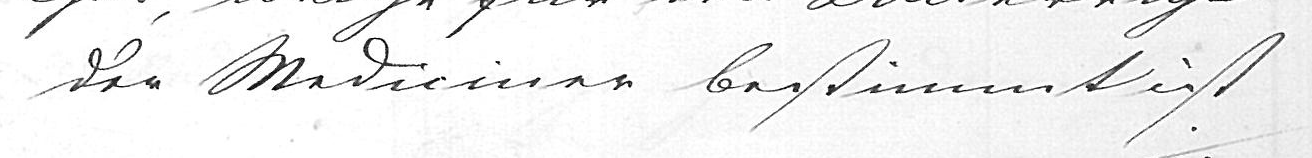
der Mediciner bestimmt ist
